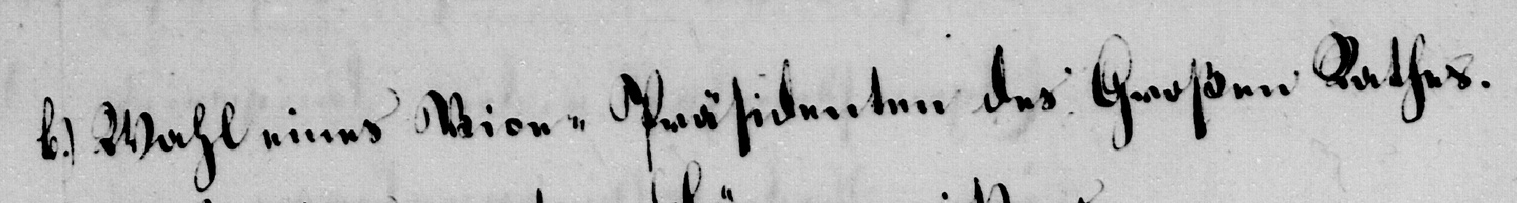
b.) Wahl eines Vice-Präsidenten des Großen Rathes.
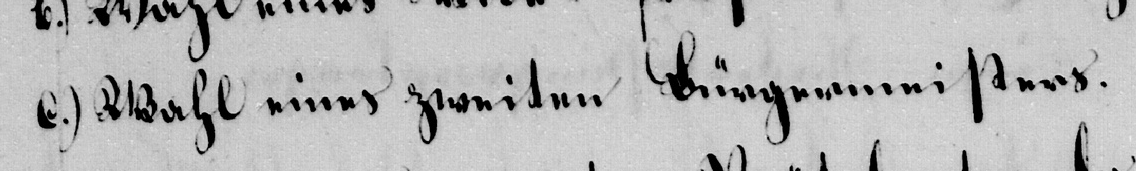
c.) Wahl eines zweiten Bürgermeisters.
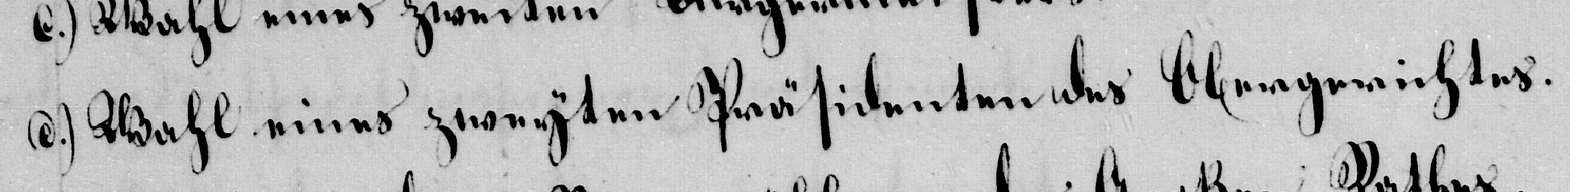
d.) Wahl eines zweyten Präsidenten des Obergerichtes.
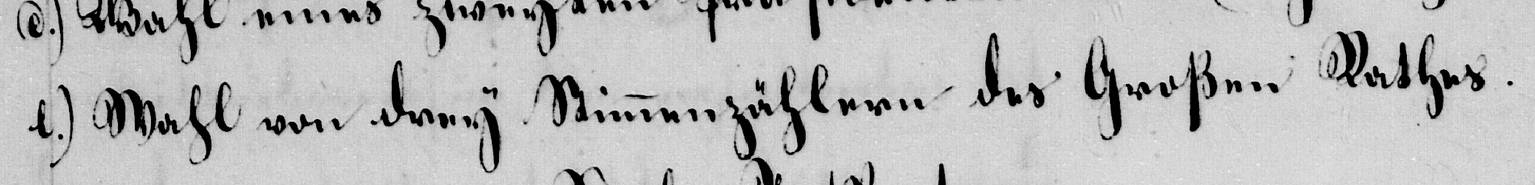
e.) Wahl von drey Stimmenzählern des Großen Rathes.
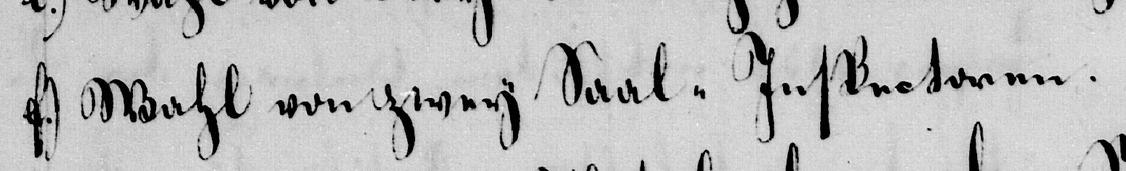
f.) Wahl von zwey Saal-Inspectoren.
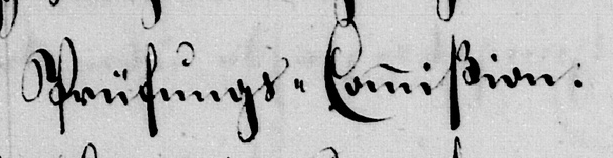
rüfungs-Commißion.
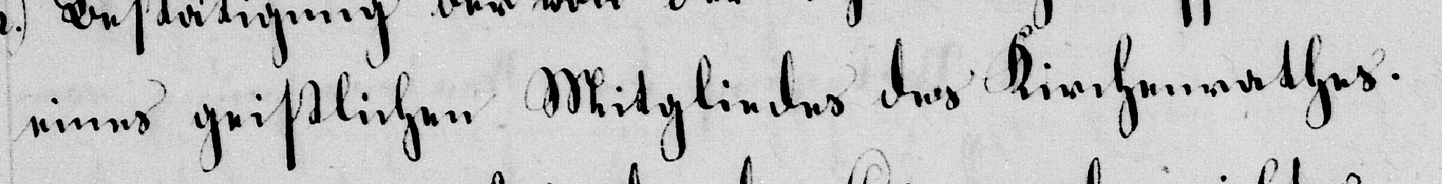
eines geistlichen Mitgliedes des Kirchenrathes.
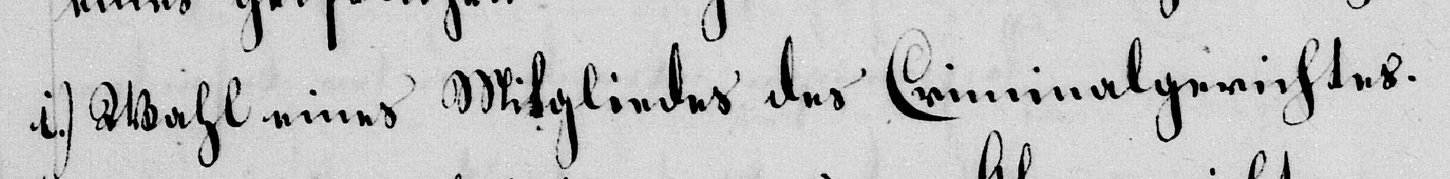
i.) Wahl eines Mitgliedes des Criminalgerichtes.
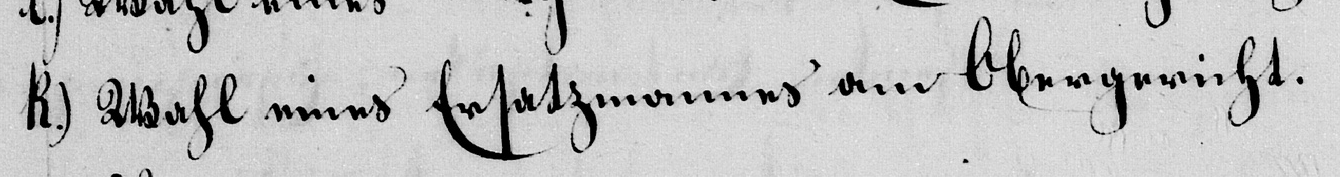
k.) Wahl eines Ersatzmannes am Obergericht.
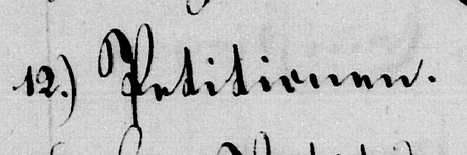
12.) Petitionen.
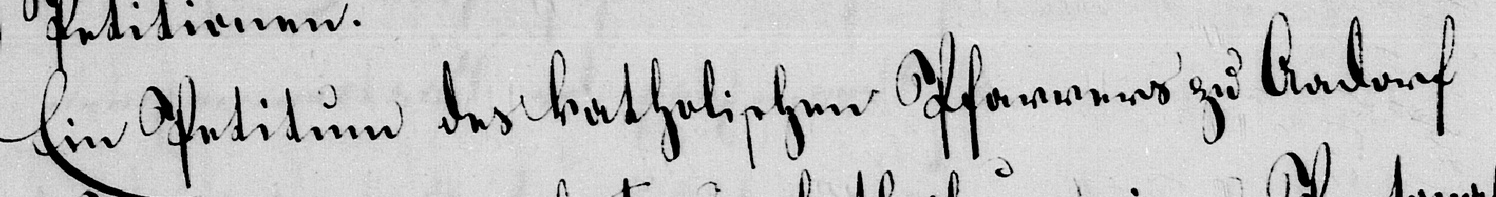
Ein Petitum des katholischen Pfarrers zu Aadorf
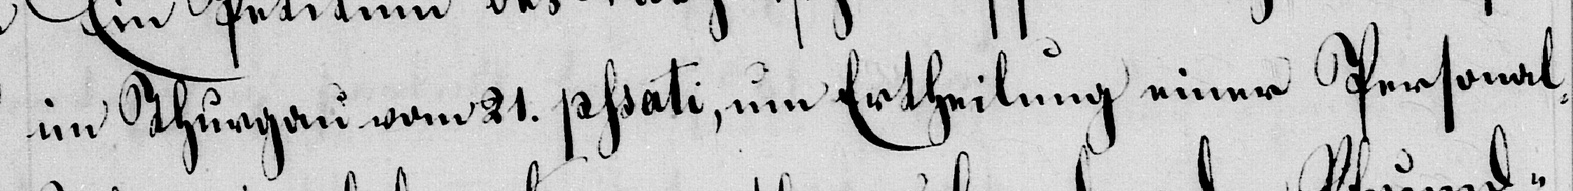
im Thurgau vom 21. passati, um Ertheilung einer Persona¬
